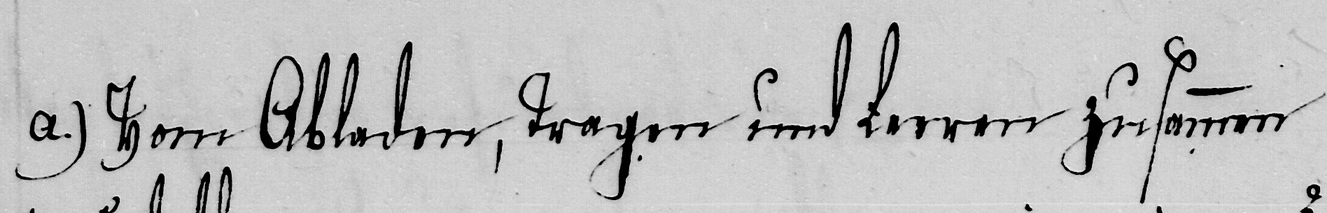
a.) Vom Abladen, Tragen und Leeren zusammen
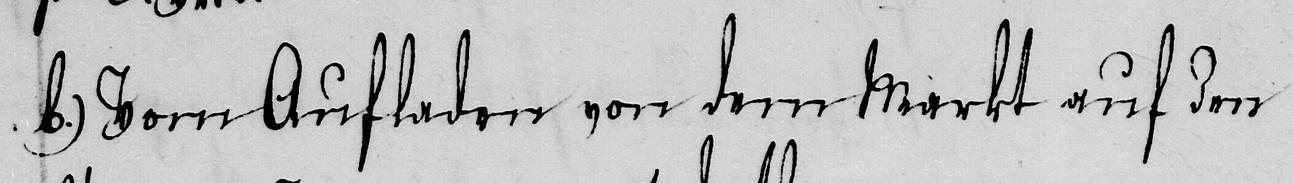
b.) Vom Aufladen von dem Markt auf den
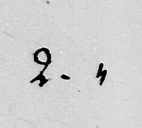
2.
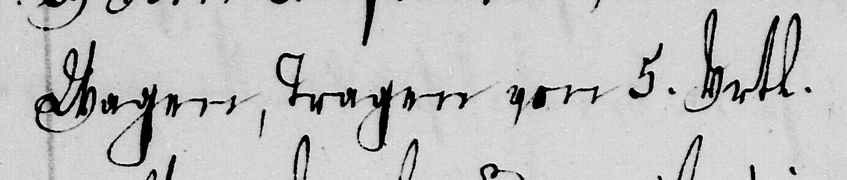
Wagen, Tragen von 5. Vrt¬
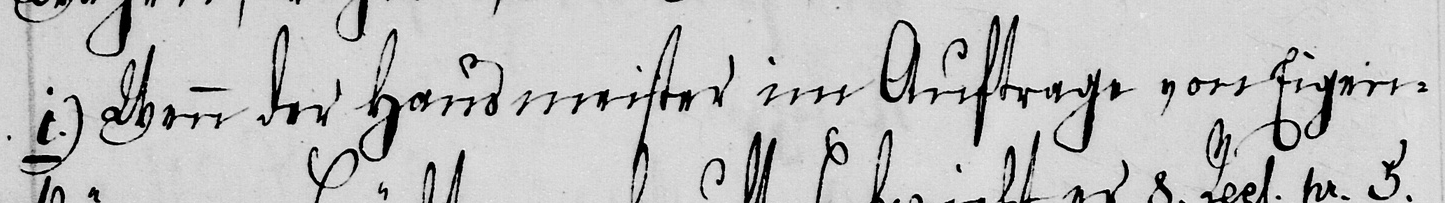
i.) Wenn der Hausmeister im Auftrage von Eigen¬
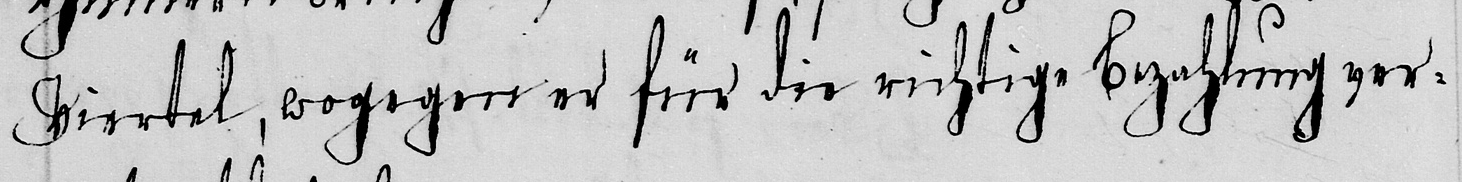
Viertel, wogegen er für die richtige Bezahlung ver¬
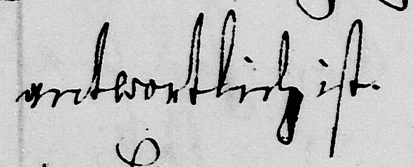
antwortlich ist.
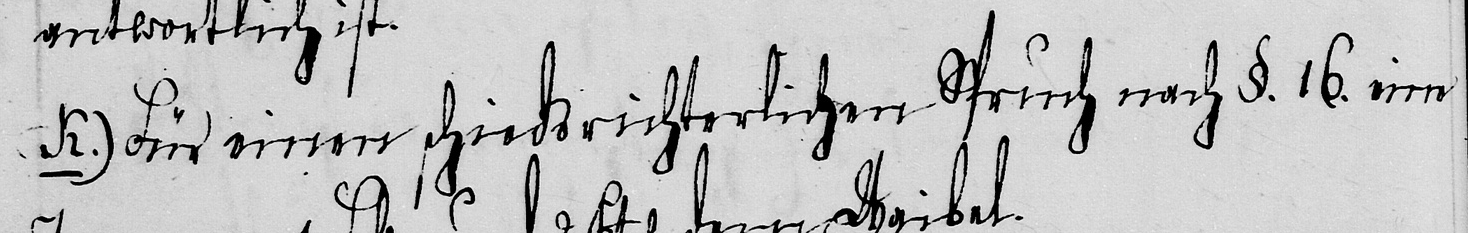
k.) Für einen schiedsrichterlichen Spruch nach §. 16. eine
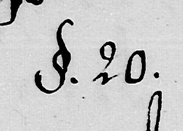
§. 20.
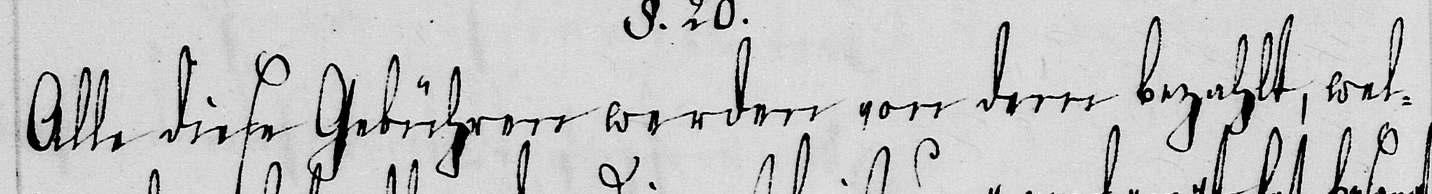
Alle diese Gebühren werden von dem bezahlt, wel¬
